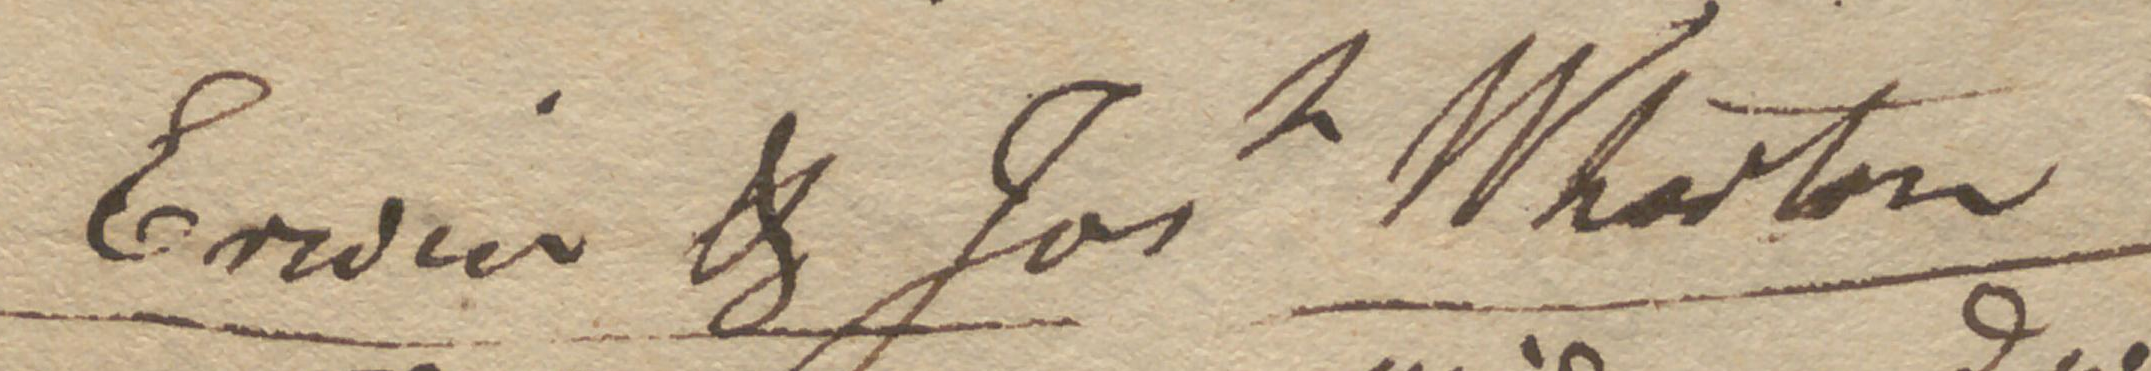Erwin & Jos^h. Wharton
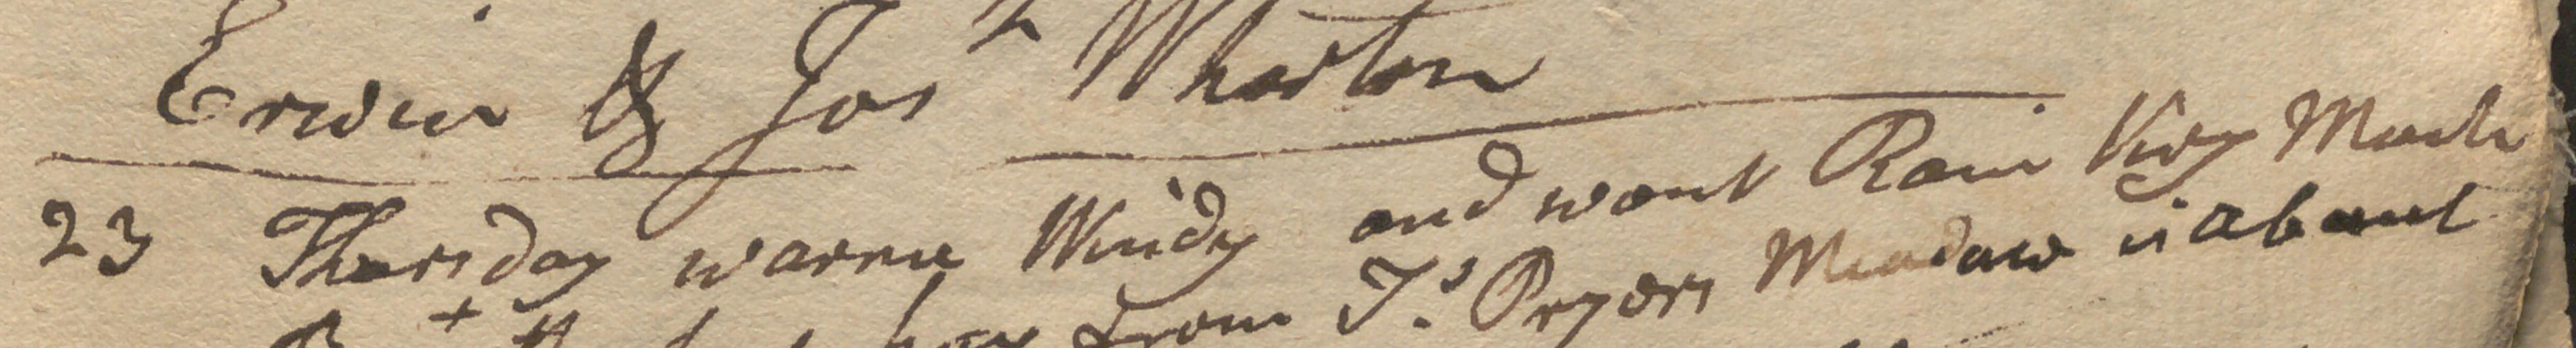23 Thursday warny Windy and want Rain Very Much
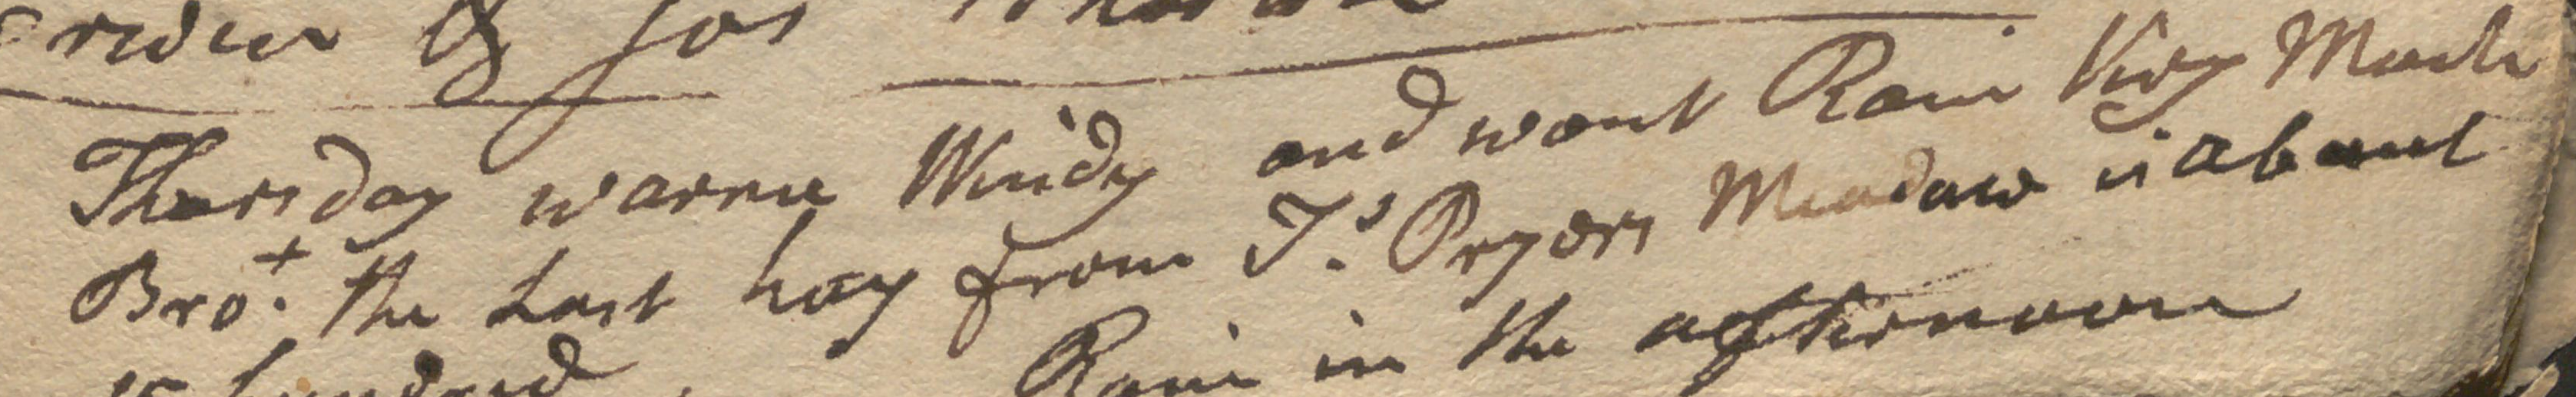Bro^t. the Last hay from T^s. Pryors Meadow is about
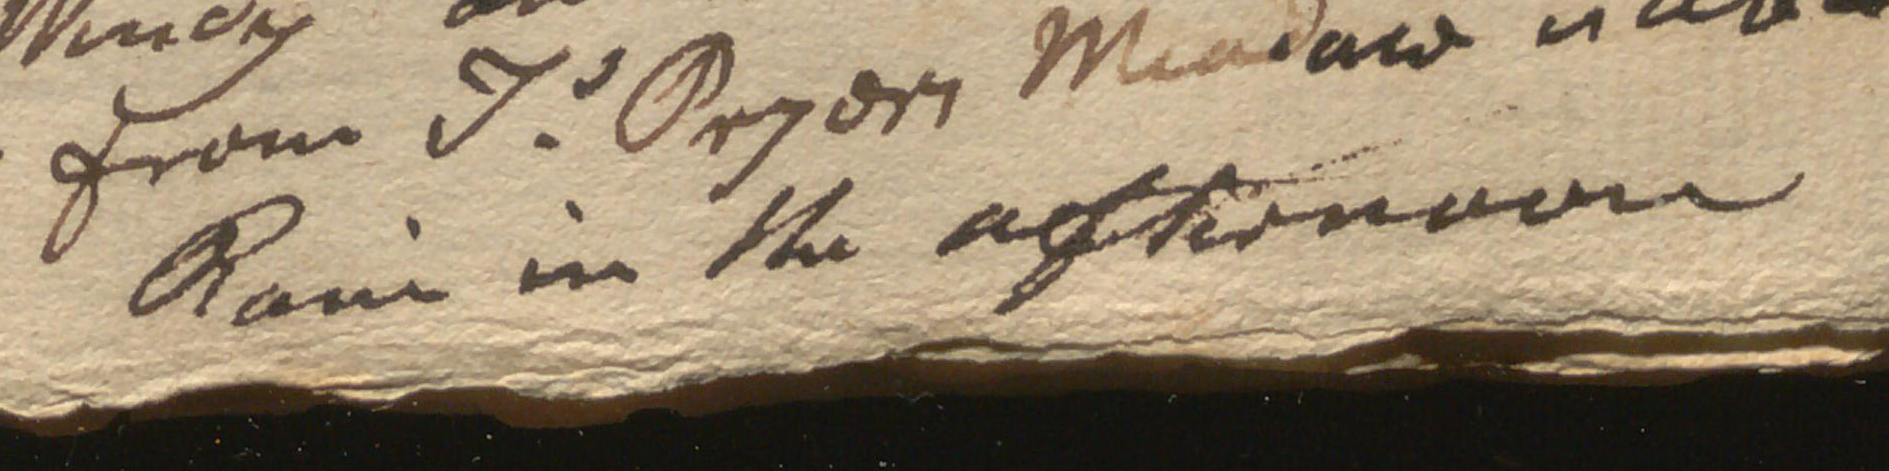Rain in the aftornoon
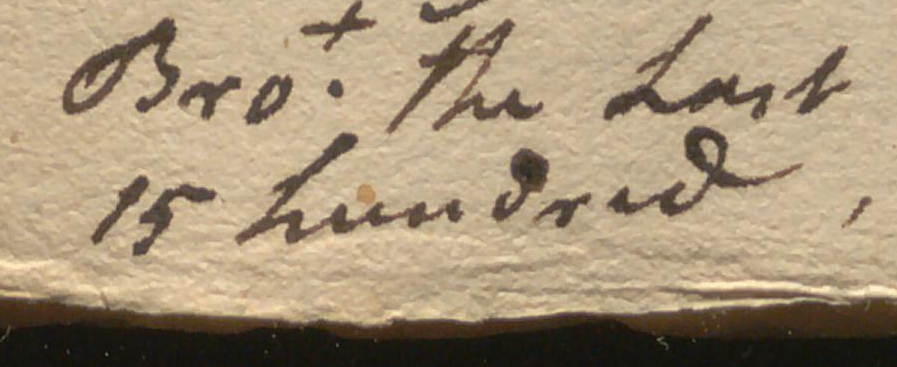15 hundred
